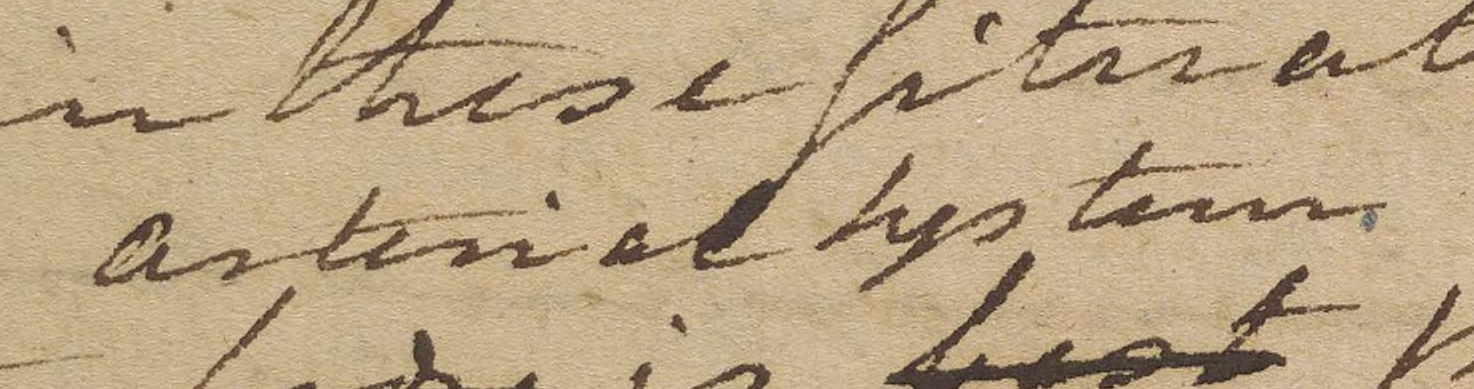arterial system
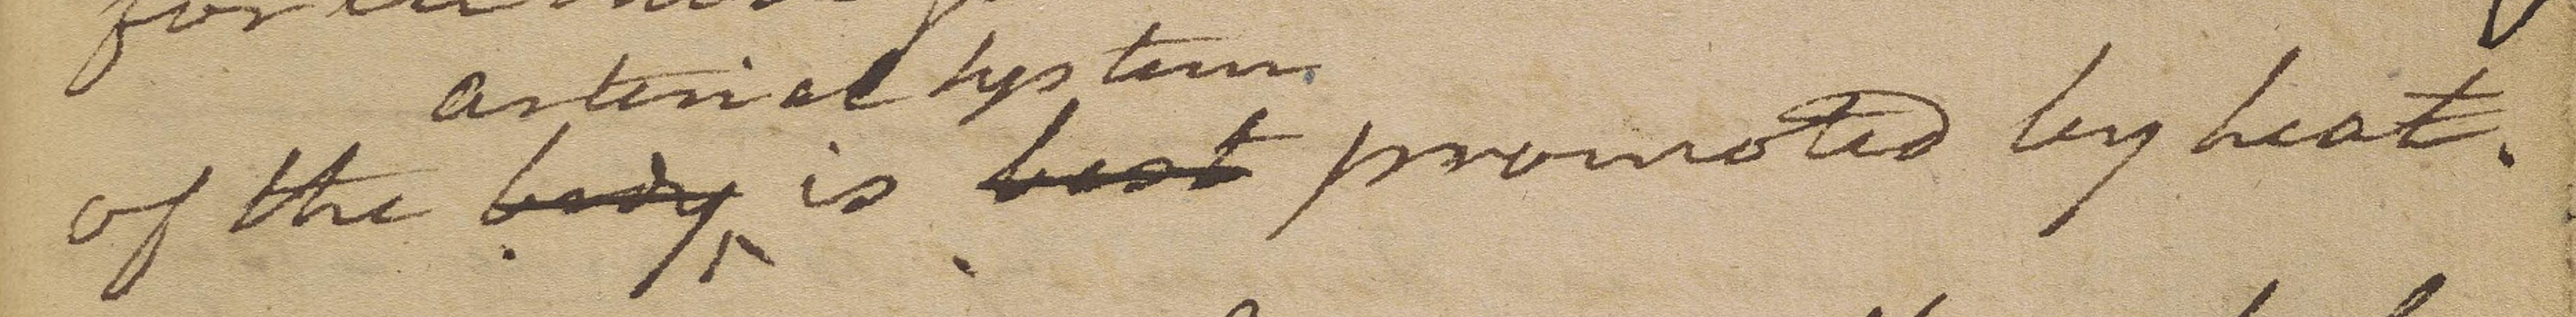of the [body] ^ is [best] promoted by heat.
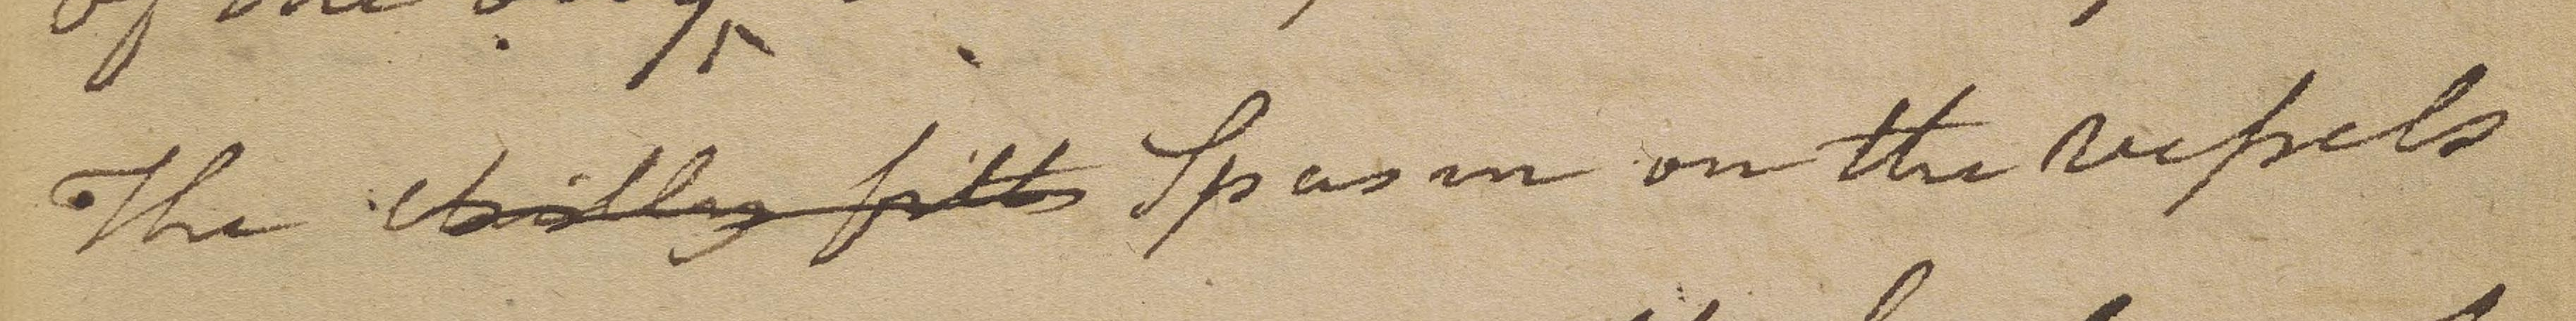The [chilly fitt] spasm on the vessels
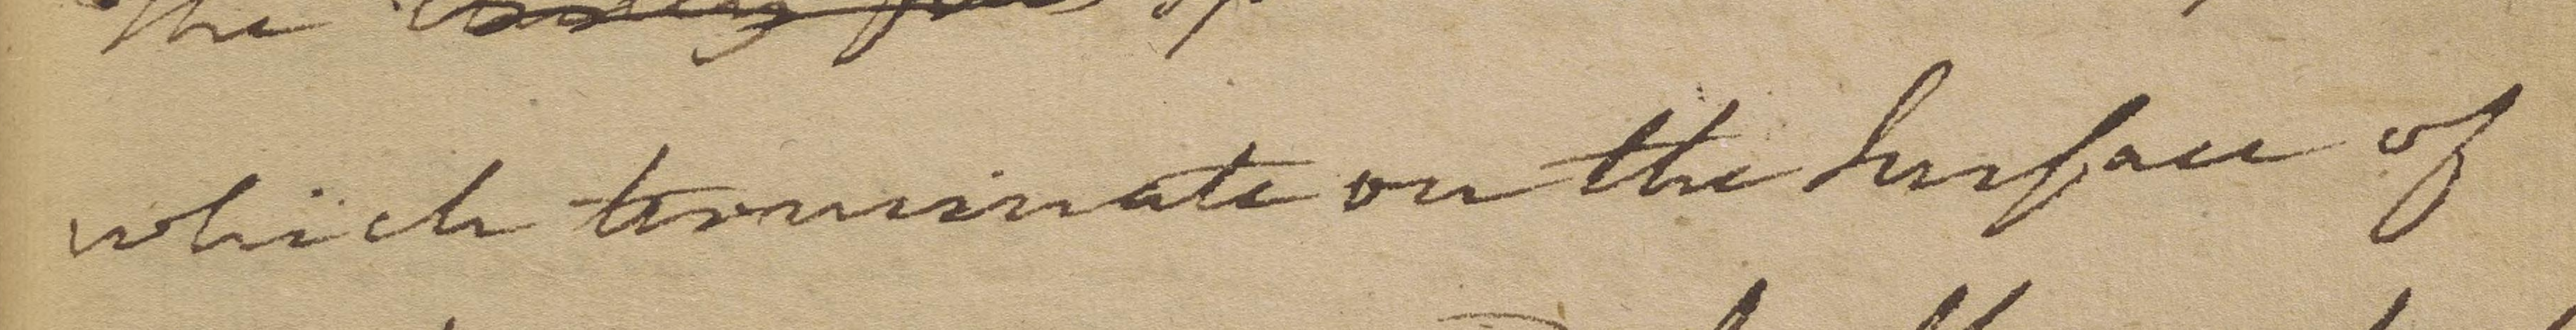which terminate on the surface of
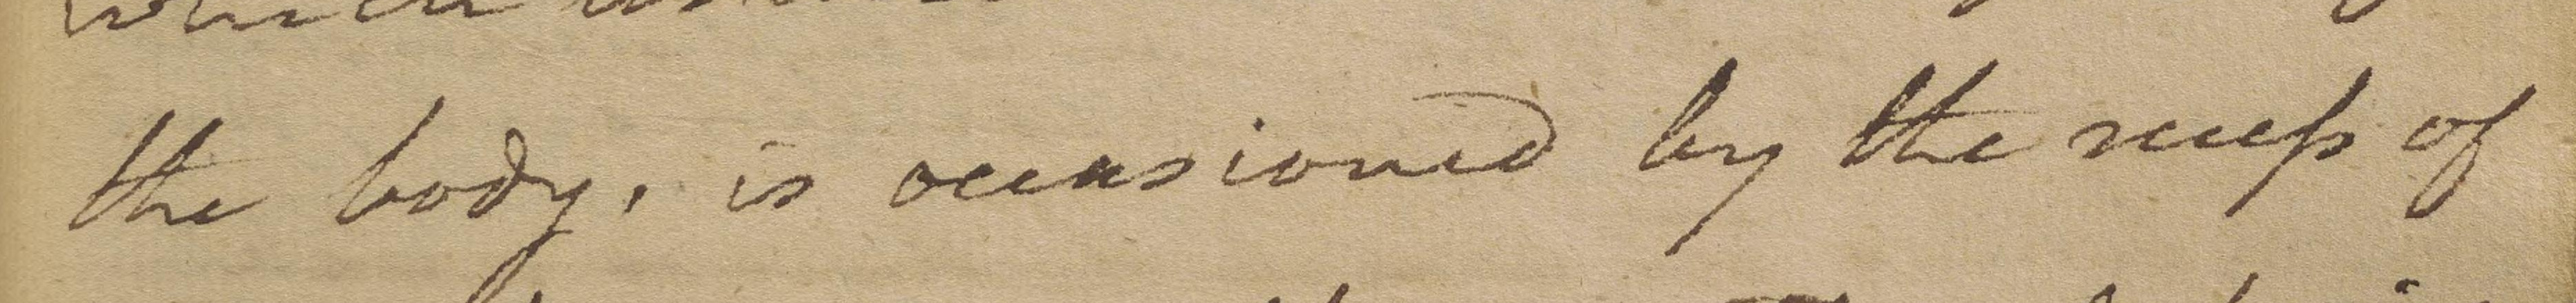the body, is occasioned by the excess of
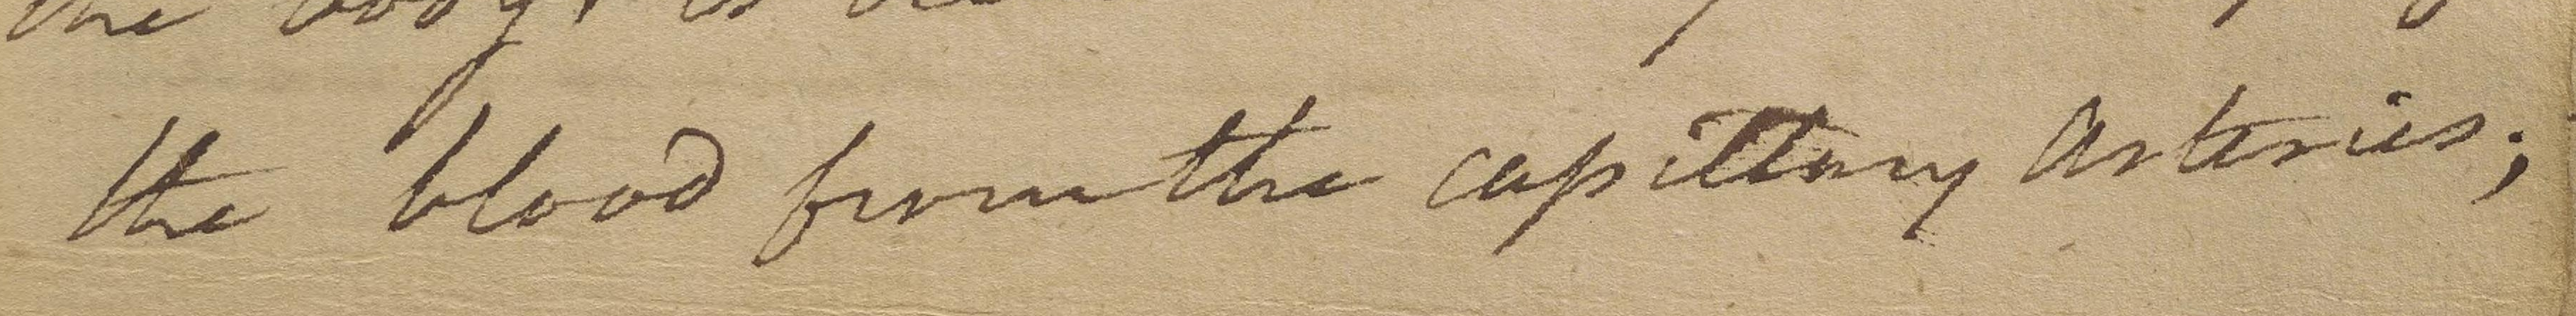the blood from the capillary arteries;
